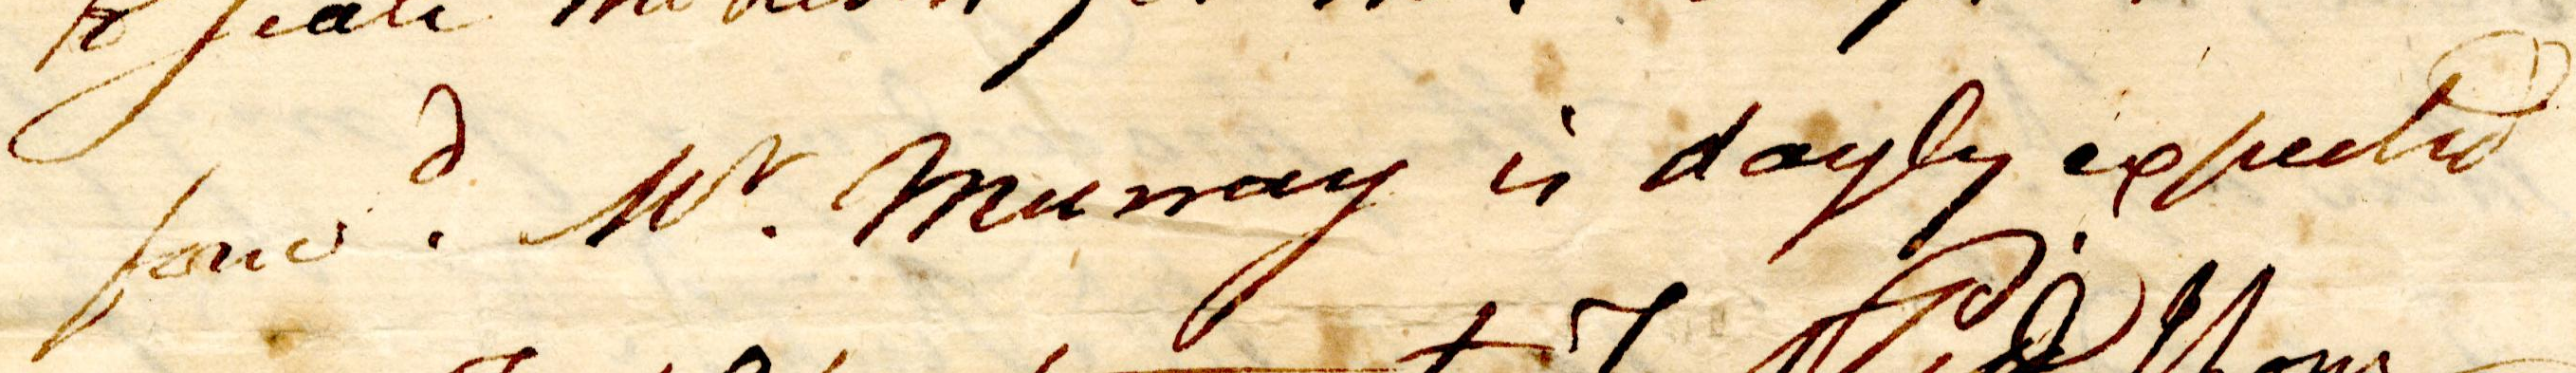favor^d. M^r Murray is dayly expected
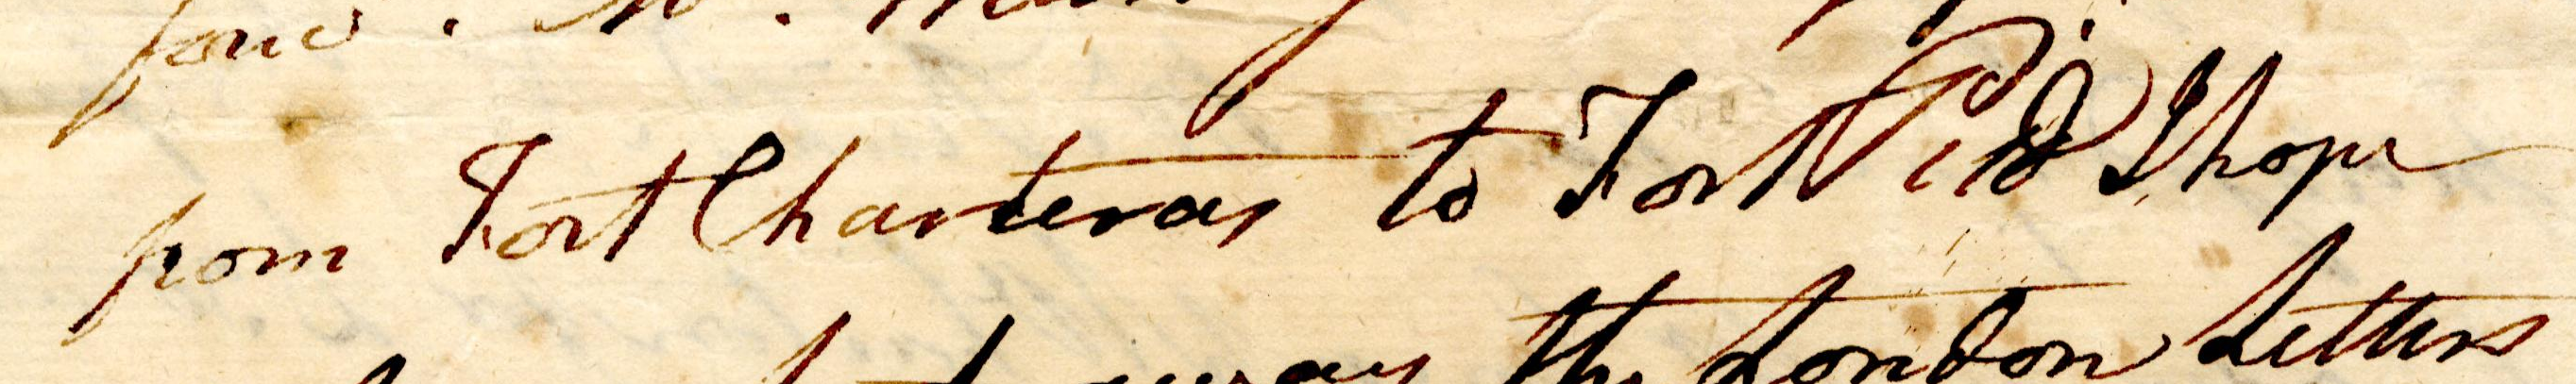from Fort Charteros to Fort Pitd I hope
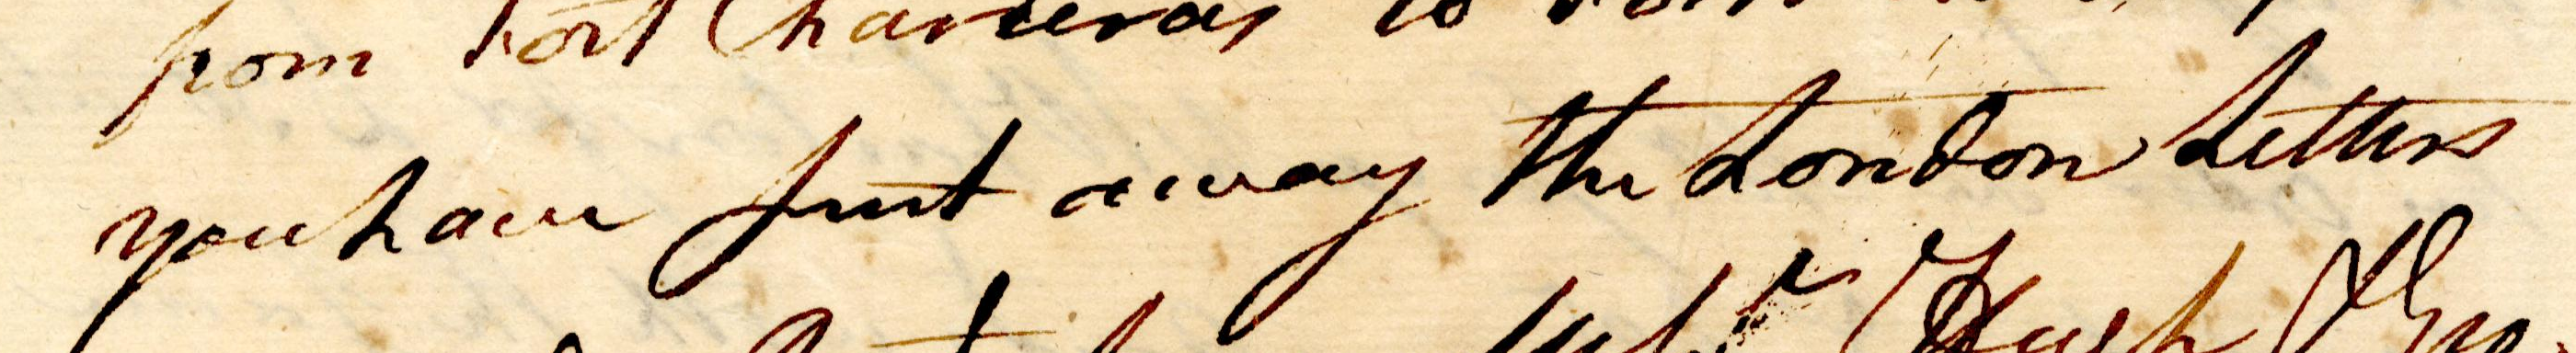you have sent away the London Letters
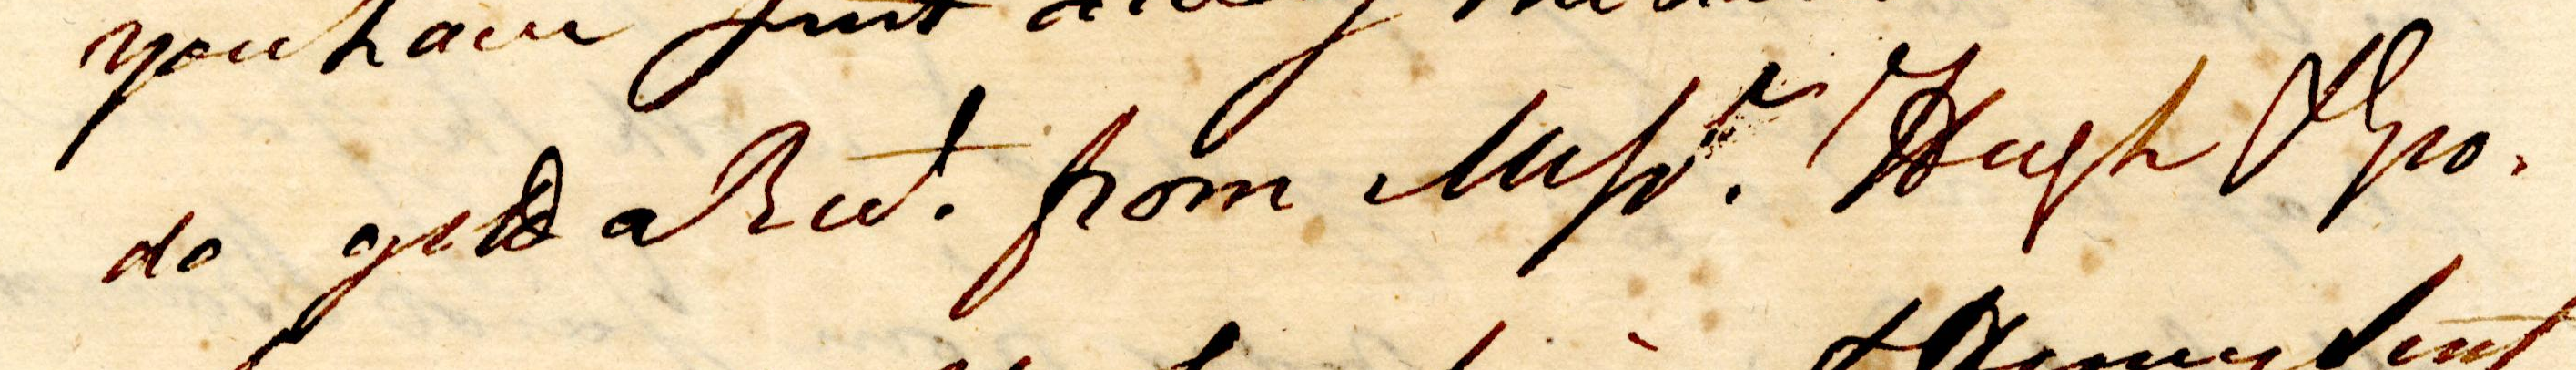do getd a Rec^t. from Mess^rs. Hugh & Geo.
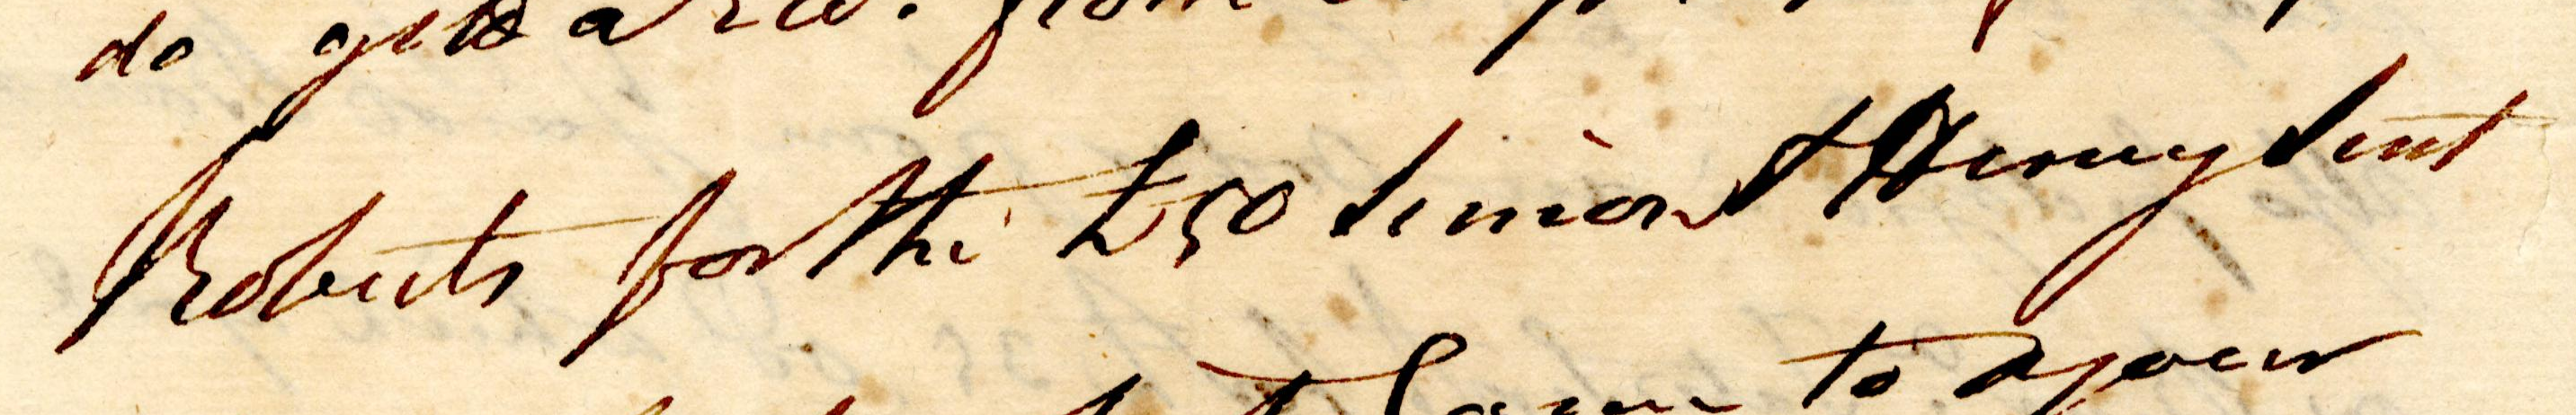Roberts for the £50 lineon & Money sent
